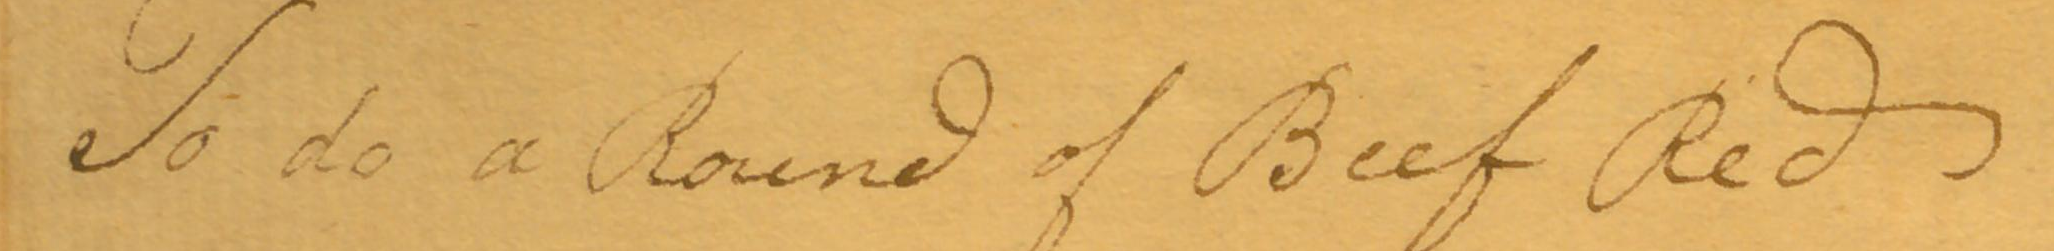To do a Round of Beef Red
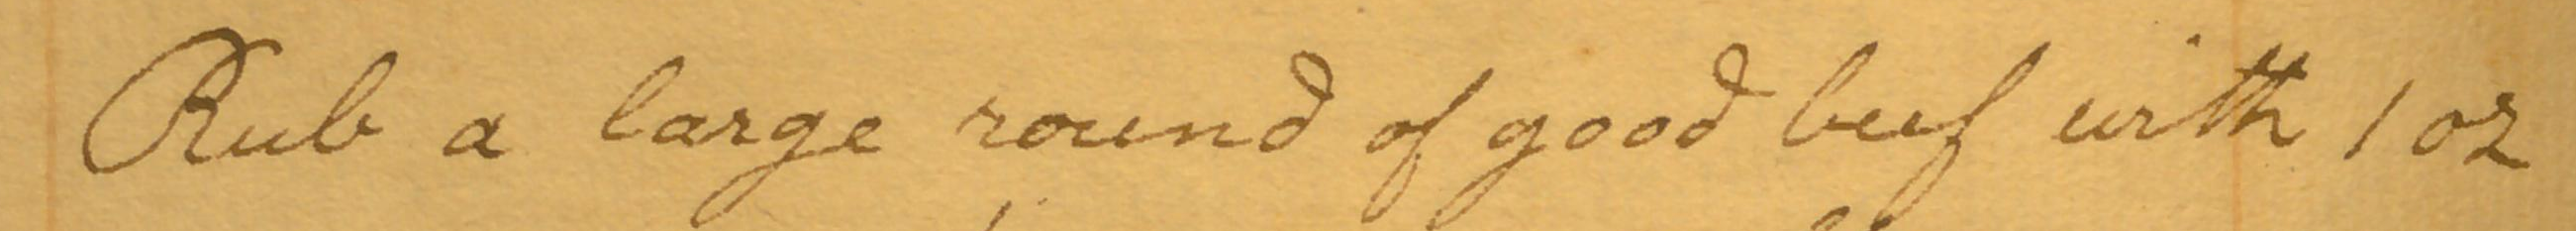Rub a large round of good beef with 1 oz
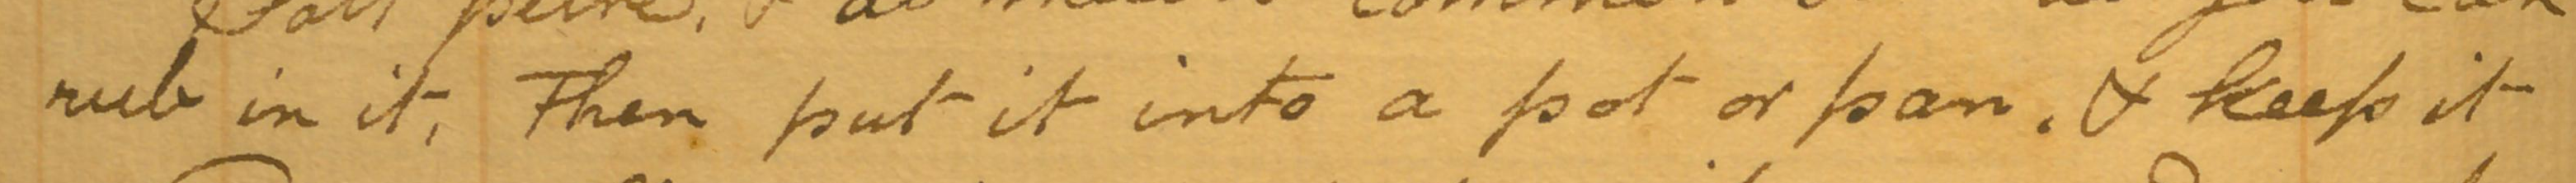rub in it, Then put it into a pot or pan & keep it
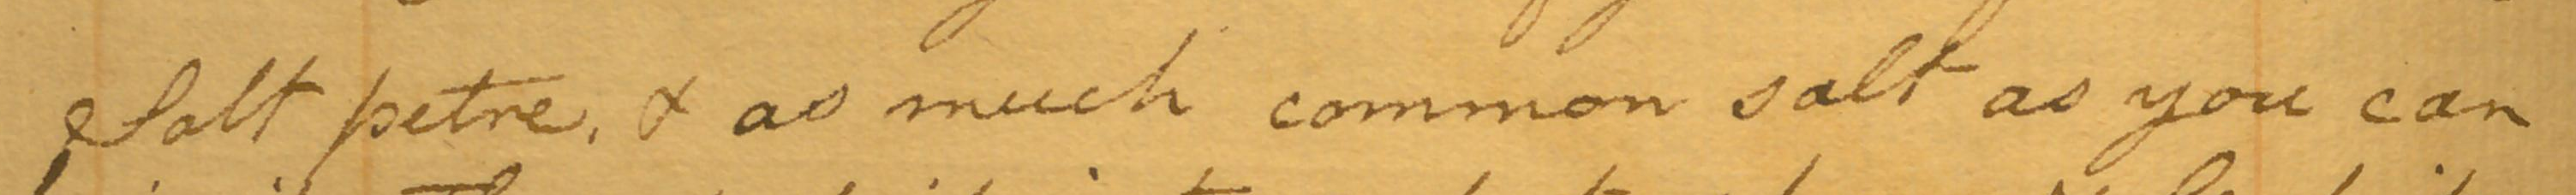salt petre, & as much common salt as you can
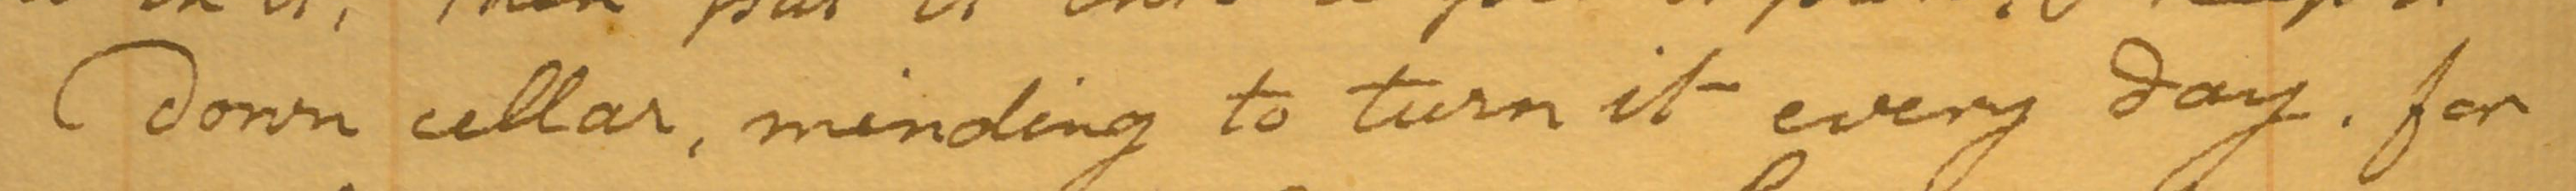down cellar, minding to turn it every day, for
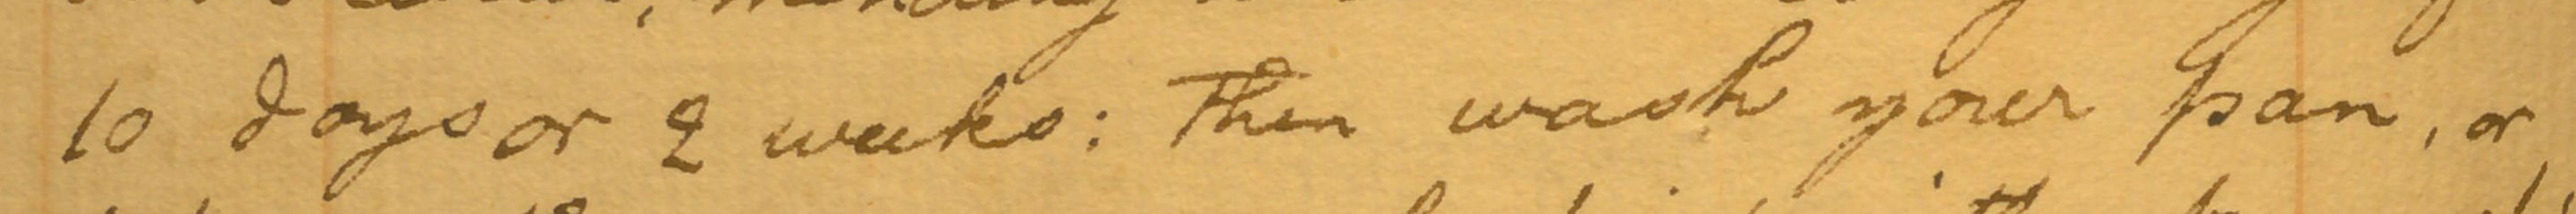10 days or 2 weeks: then wash your pan, or
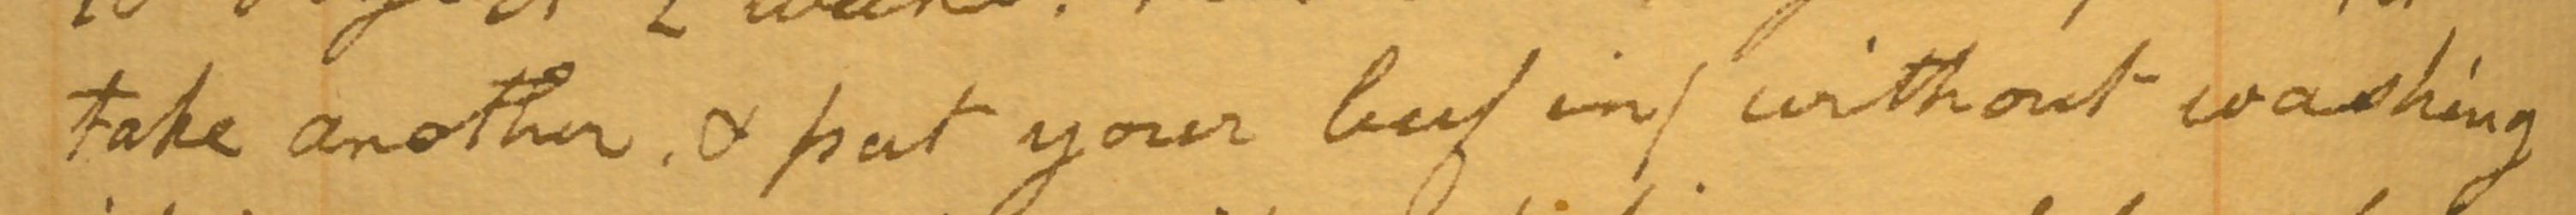take another, & put your beef in /without washing
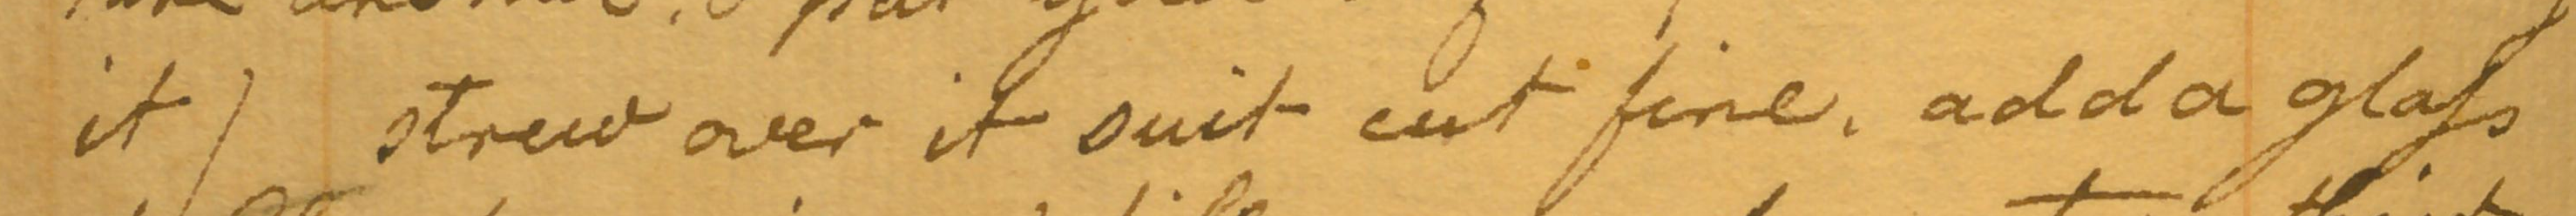it/ strew oer it suit cut fine. add a glass
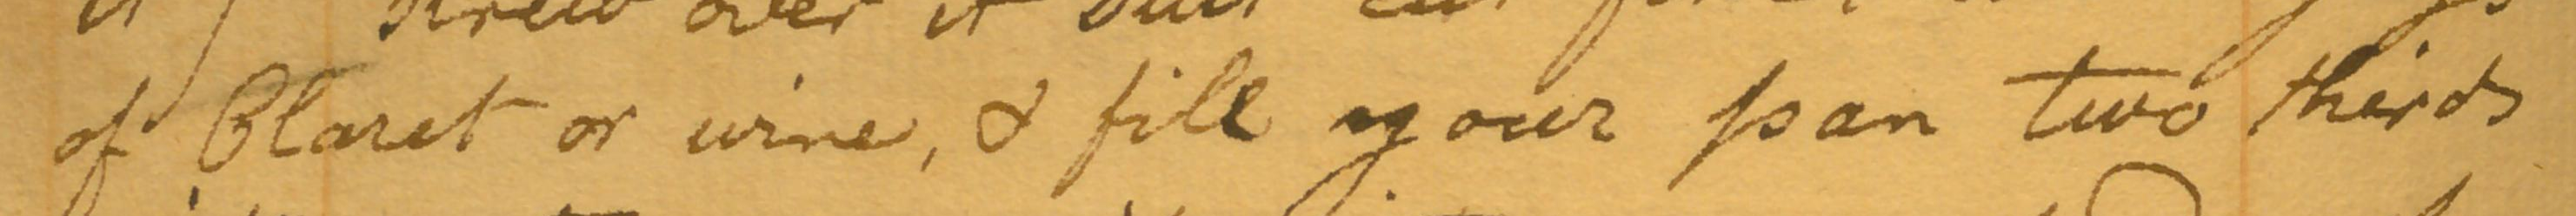of Claret or wine, & fill your pan two thirds
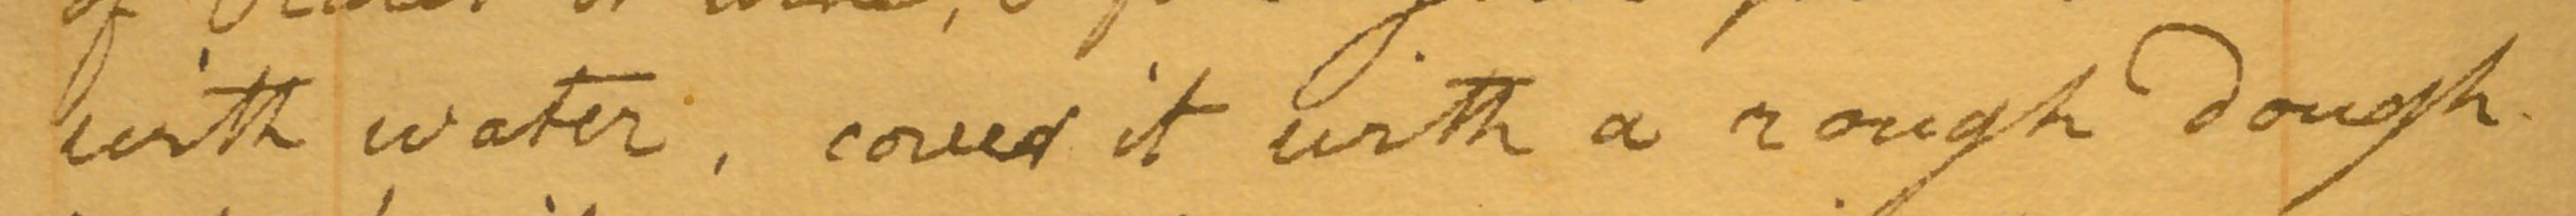with water, cover it with a rough dough
